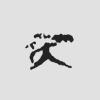夭
